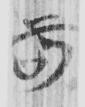可
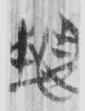埶
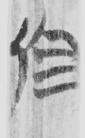於
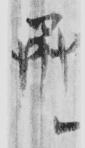承
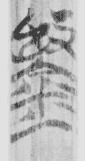鋻
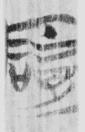{石疐}
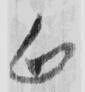㠯（以）
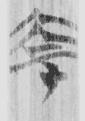亢
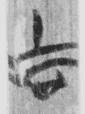吉
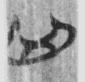凶
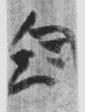侌
